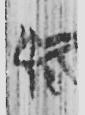巟
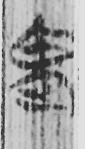畏
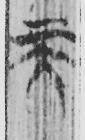天
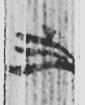之
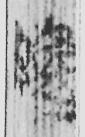{降止}
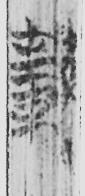載
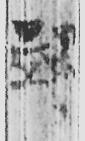卹
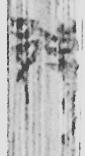邦
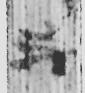之
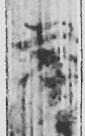不
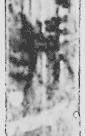{爿貝}
